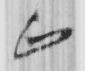㠯（以）
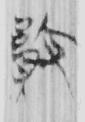敗
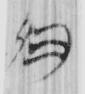於
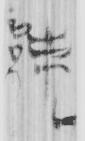邦
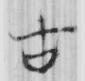古
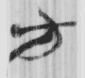方
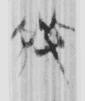敓
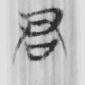君
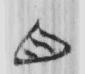目
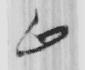㠯（以）
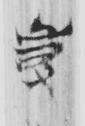事
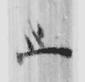之
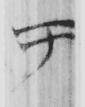于
